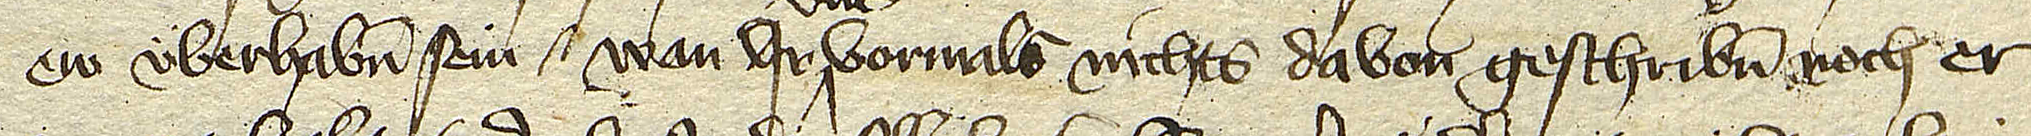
ew v̈berhabn* ſein / wan Ir vormals nichts davon geſchribn* noch er
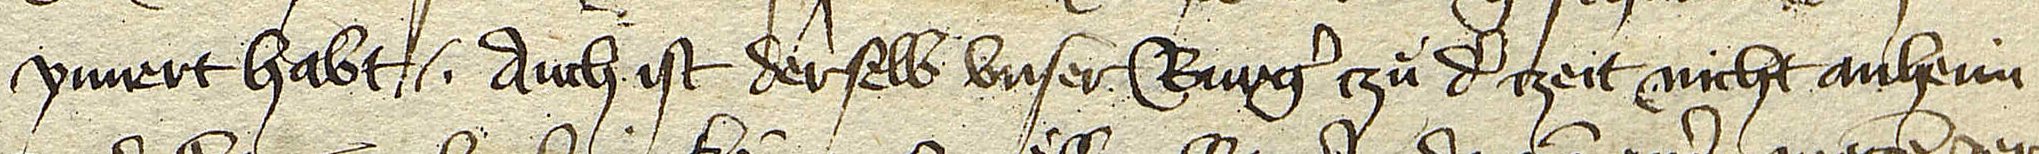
ynnert habt / . Auch iſt derſelb vnſer Burg* cʒü d* cʒeit nicht anheim
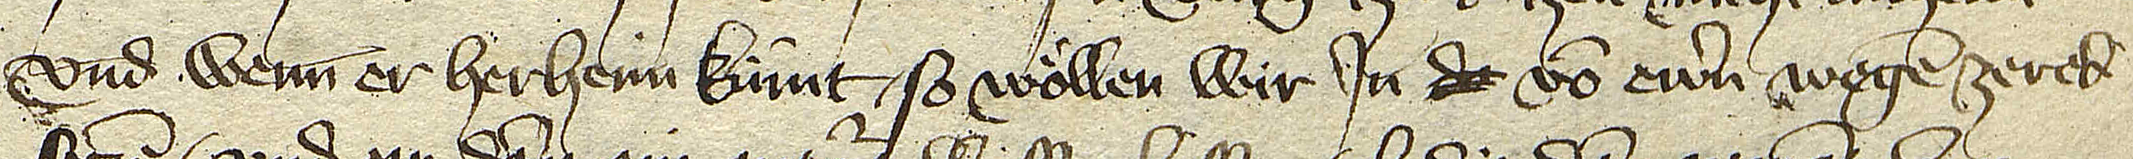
vnd wenn er herheim kümt / ſo wöllen wir In do vo* ew*n wege* cʒered
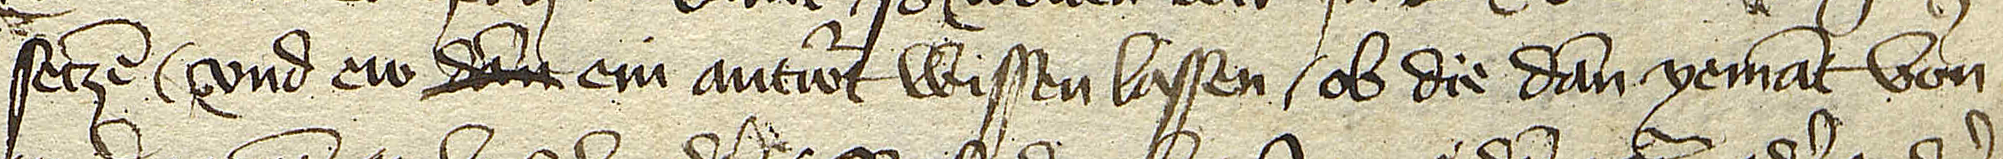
ſecʒe* / vnd ew dan* ein antw*t wiſſen laſſen / ob die dan* yemat* von
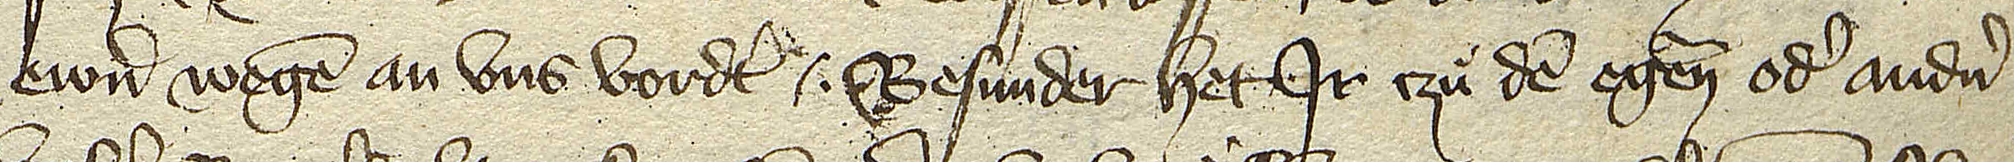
ewn* wege* an vns vordt* /. Beſunder het Ir cʒü d* egen* od* andn*
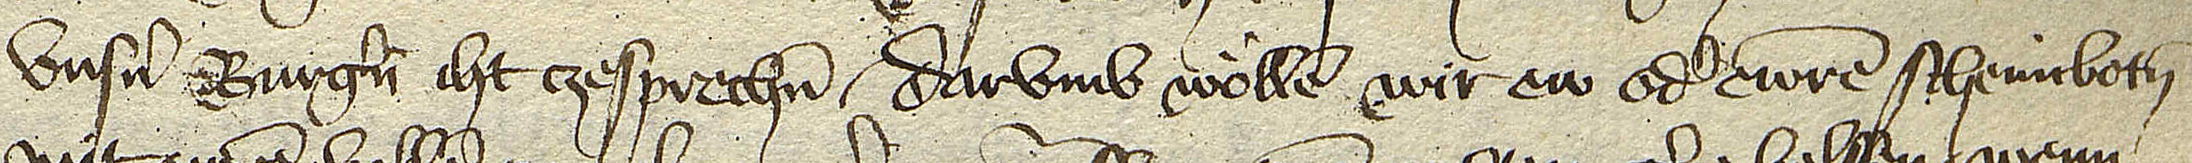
vnſn* Burg*n iht cʒeſprechn* / Darvmb wölle wir ew od* ewre* ſcheimbotn*
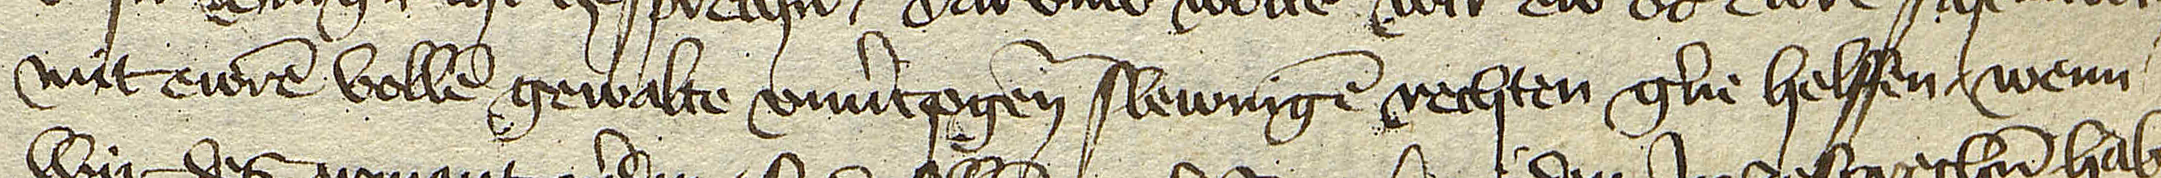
mit ewre* volle* gewalte vnu*cʒogen* ſlewnige* rechten g*ne helffen / wenn
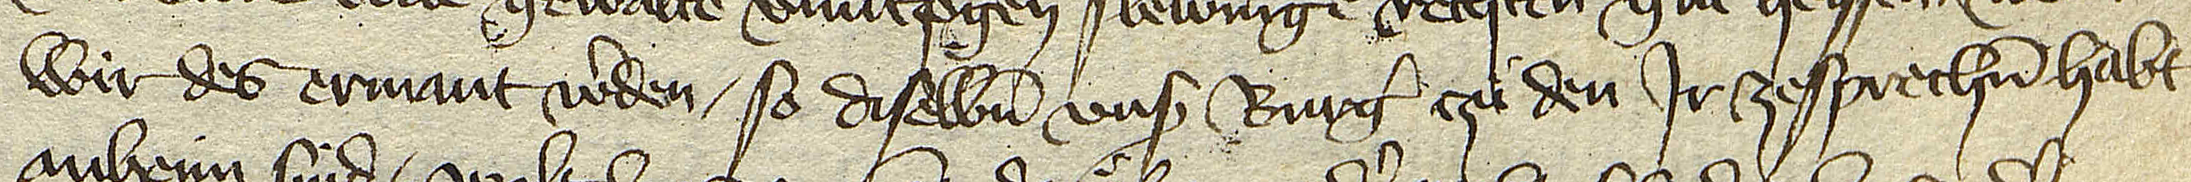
wir des ermant w*den / ſo dieſelbn* vnſ* Burg* cʒü Ir cʒeſprechn* habt
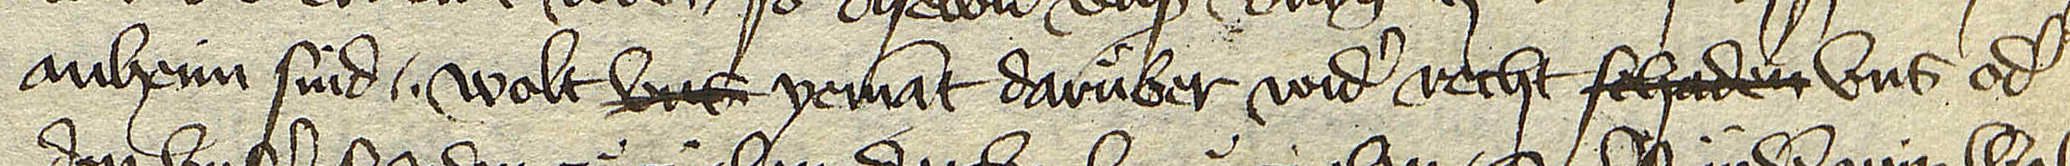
anheim ſind / . wolt vns yemat* darüber wid* recht ſchaden vns od*
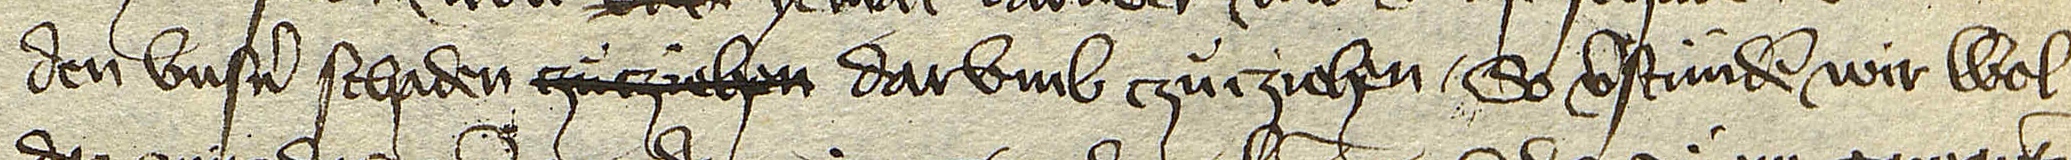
den vnſn* ſchaden cʒücʒiehen darvmb cʒücʒiehen / So v*ſtünd* wir wol
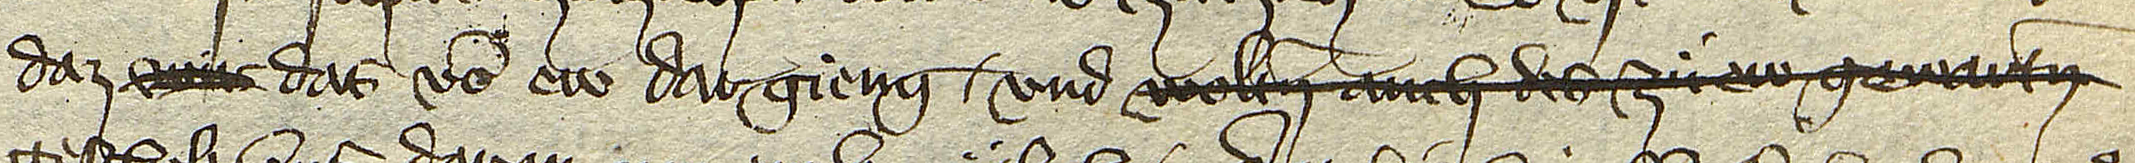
daʒ wir das vo* ew dargieng / vnd woltn* des cʒü ew gewartn*
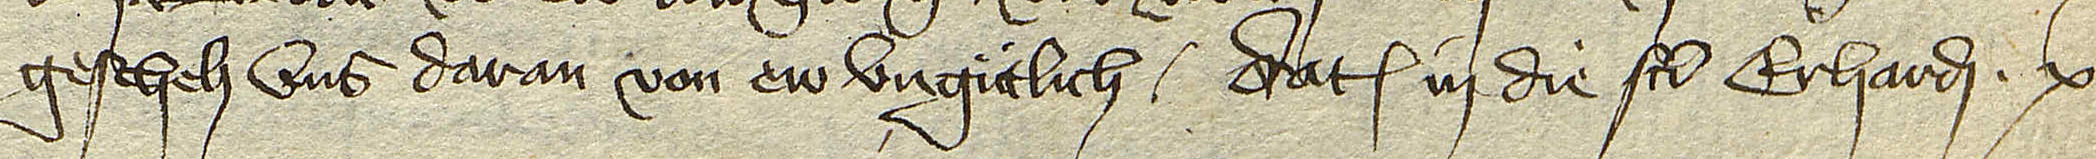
geſcheh vns daran von ew vngütlich / Dat* in die ſci* Erhardi . x*
